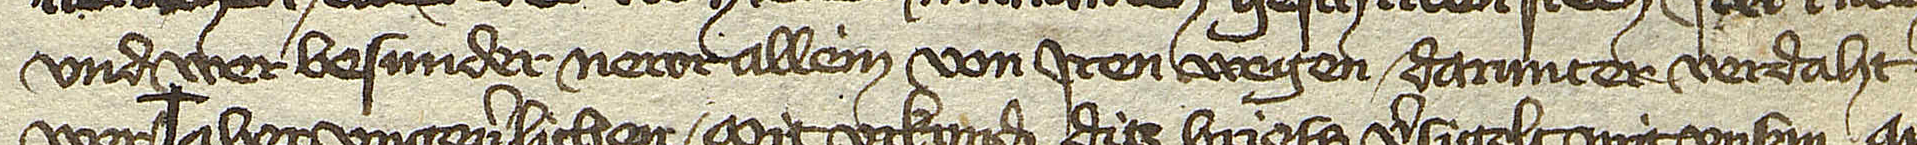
vnd wer beſunder newr allein von Iren wegen / darunter verdaht
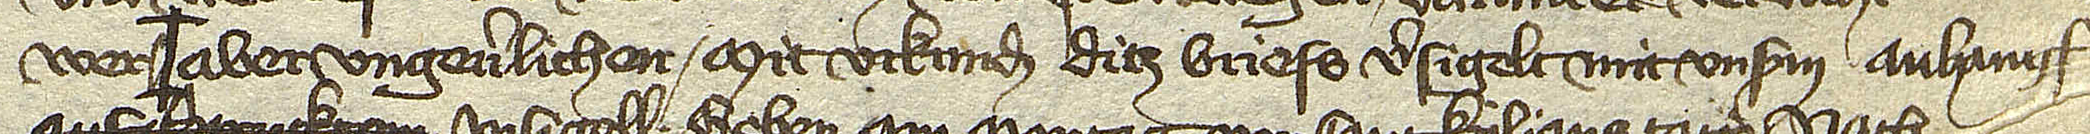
wer aber vngeu*licher / Mit vrkund dicʒ briefs v*ſigelt mit vnſ*m anhang*
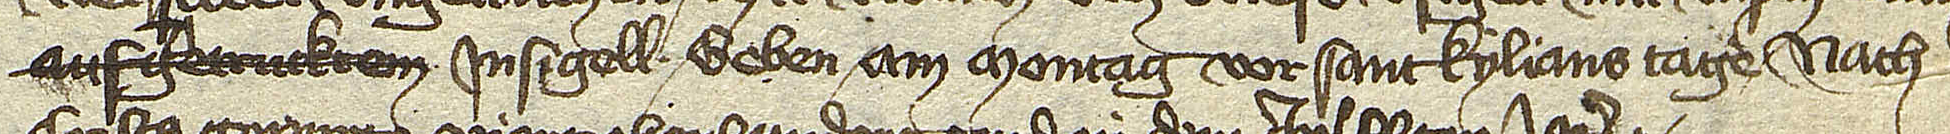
aufgetrucktem Inſigell / Geben am Montag vor ſant kylians tage Nach
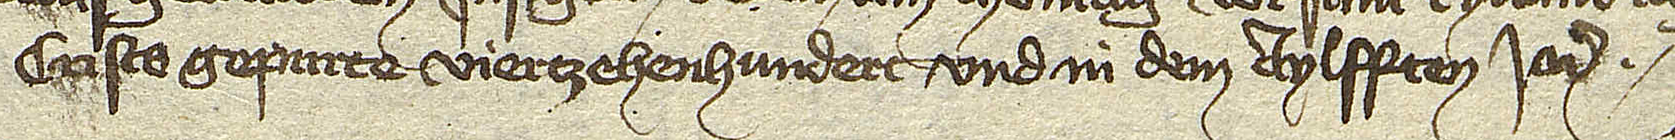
Criſts gepurte viercʒehenhundert vnd in dem Aylfften Iar* . /
